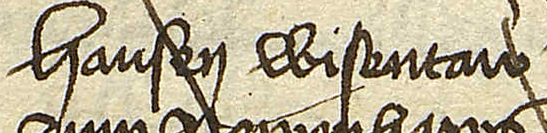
hanſen Wiſentaw*
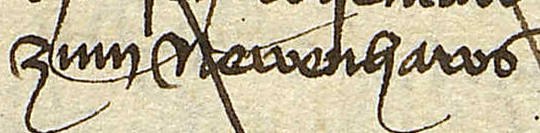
cʒum Newenhaws
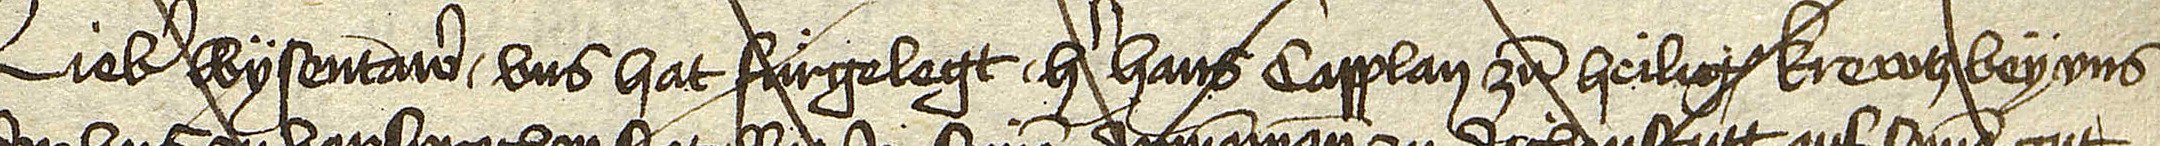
Lieb* Wyſentaw* / vns hat fürgelegt / h* hans Capplan cʒu* heilig* Krewtʒ bey vns
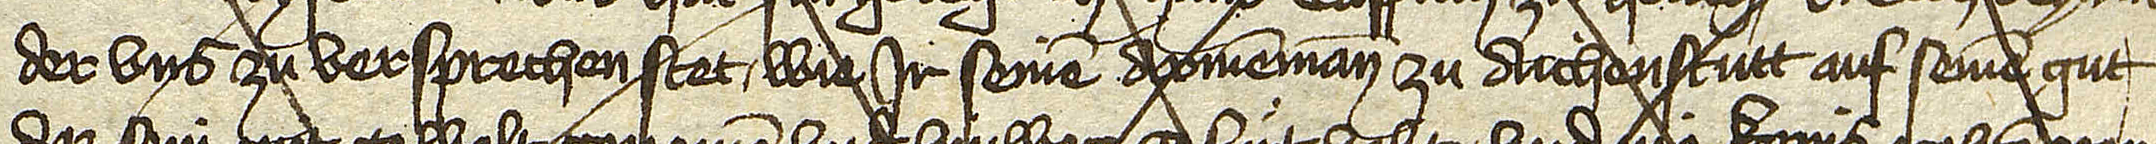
der vns cʒu verſprechen ſtet / wie Ir ſeine* Arme*man* cʒu Aichenſtutt auf ſeine* gut
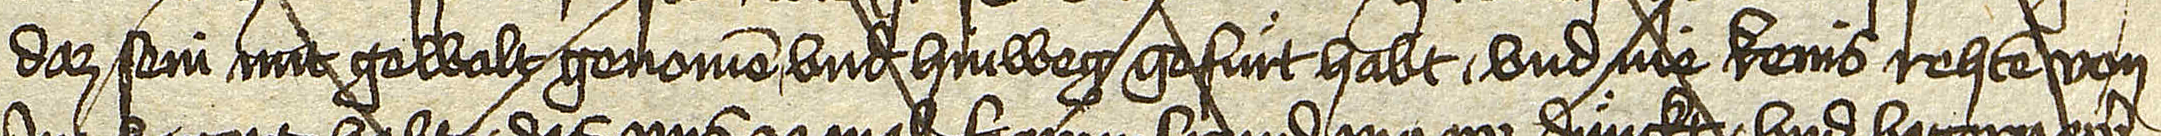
daʒ ſein mit gewalt genome* / vnd hinweg gefürt habt / vnd wie keins rehte* von
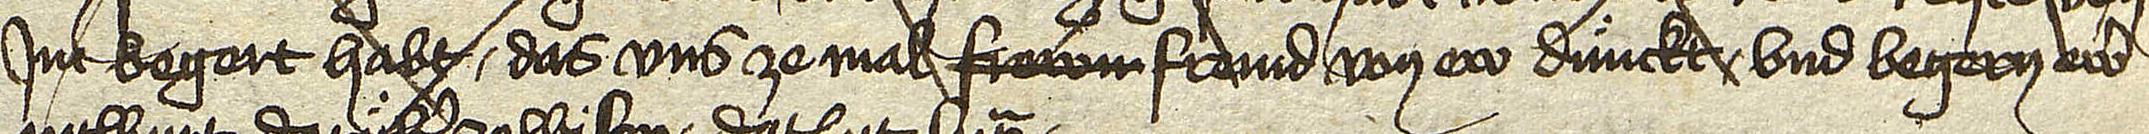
Im begert habt / das vns cʒemal frewn fremd von ew dünkt / vnd begern ew*
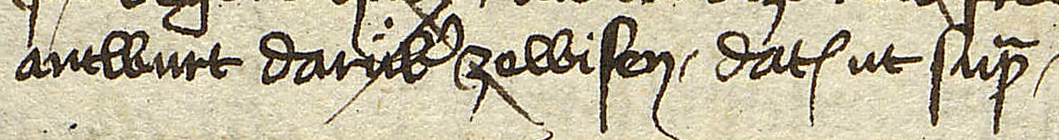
antwurt darüb* cʒewiſen / dat* ut ſup* /
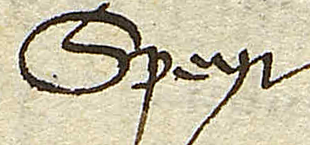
Speyr
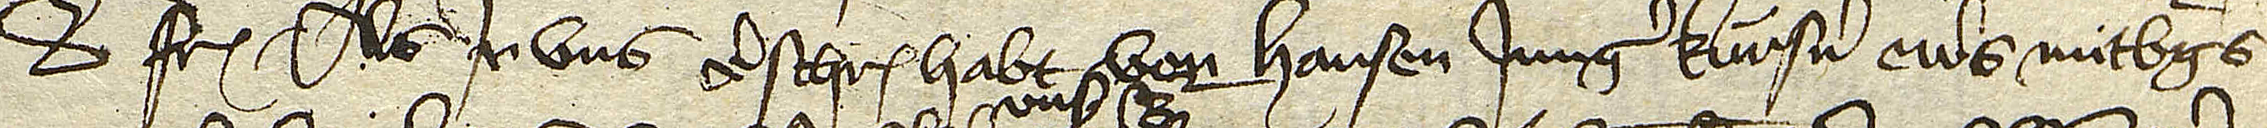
L* fr* / Als Ir vns v*ſchr* habt von hanſen Iung* kürſn* ew*s mitb*g*s
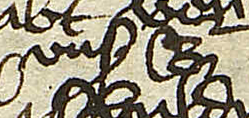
vnſ* B*
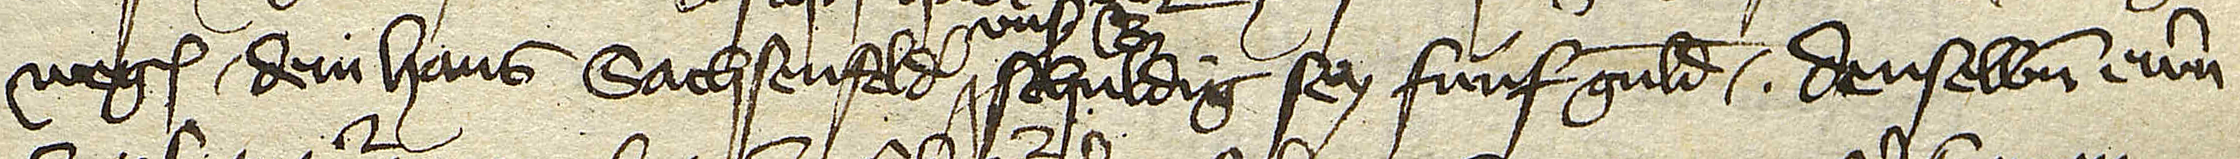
weg* / dem hans Sachſenfeld* ſchuldig ſey fünf guld* / . denſelbn* ew*n
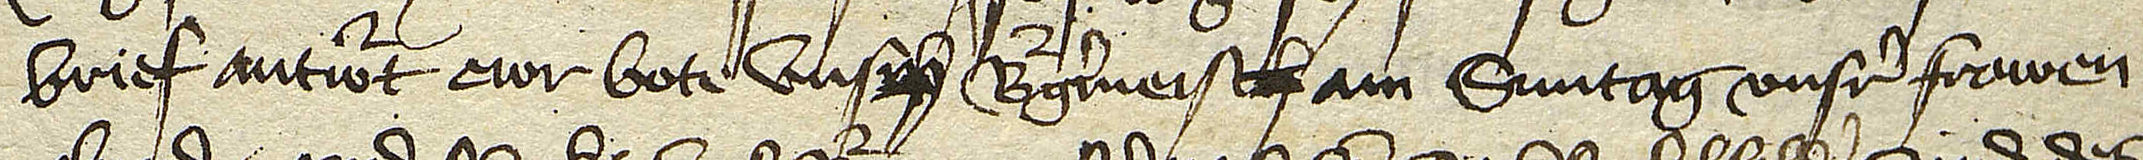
brief antw*t ewr bote vnſm* B*g*meiſth* am Suntag vnſr* frawen
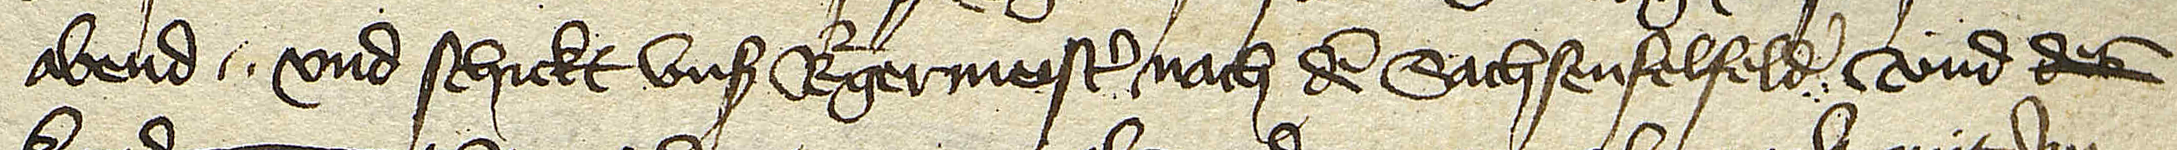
abend / . vnd ſchickt vnſ* B*germeiſt* nach d* Sachſenfelfeld* / vnd des
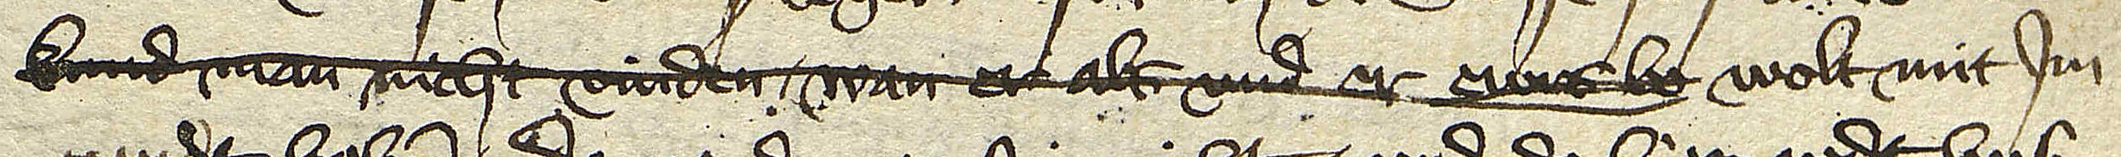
kund man nicht vinden / wan er als vnd er ews vo wolt mit Im
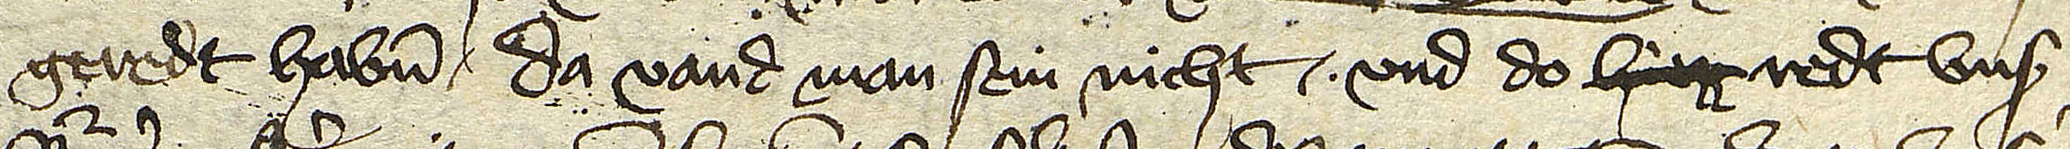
geredt habn* / Da vand man ſein nicht / . vnd do hieʒʒ redt vnſ*
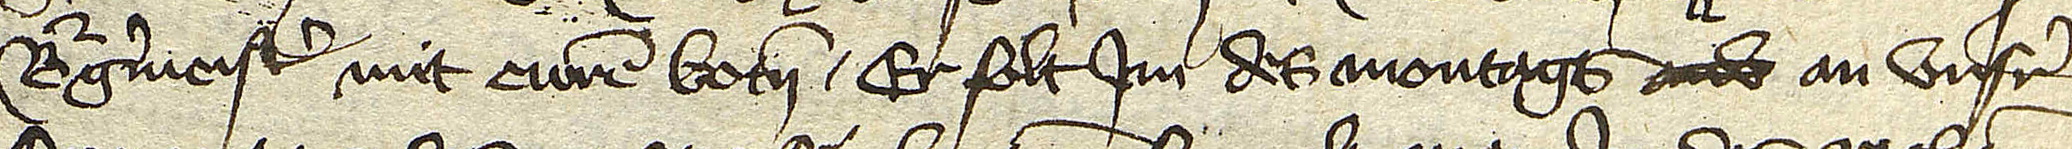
B*g*meiſt* mit ewre* botn* / Er ſolt Im des montags and an vnſr*
